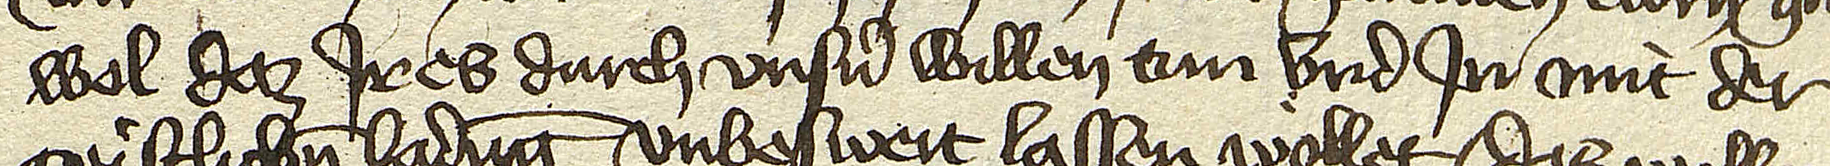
wol daʒ Ir es durch vnſn* willen tun vnd In mit der
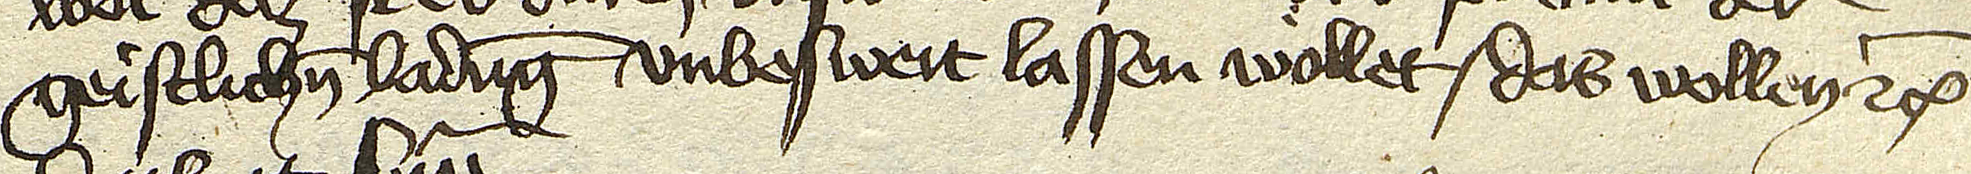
geiſtlichn* ladug* vnbeſwert laſſen wöllet / das wollen ec*
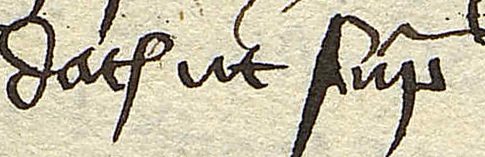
dat* ut ſup*
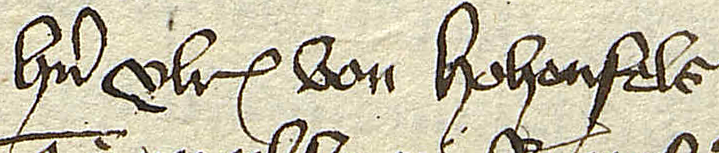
hn* vlr* von hohenfels
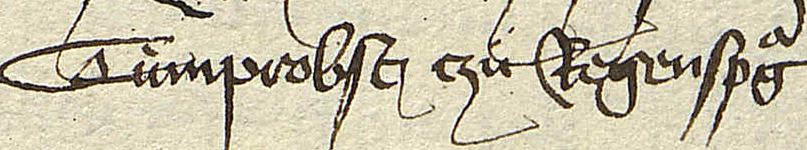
Tümprobſt cʒü Regenſp*g
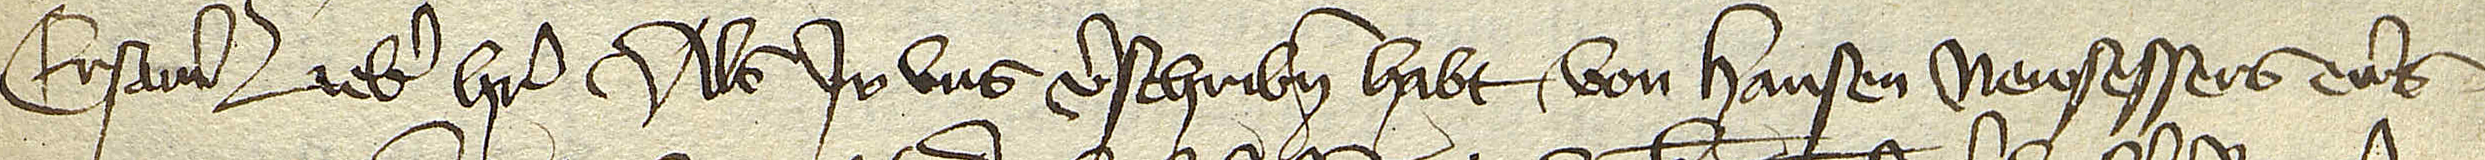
Erſam* Lieb* hr* / Als Ir vns v*ſchribn* habt / von Hanſen Newſeſſers ew*s
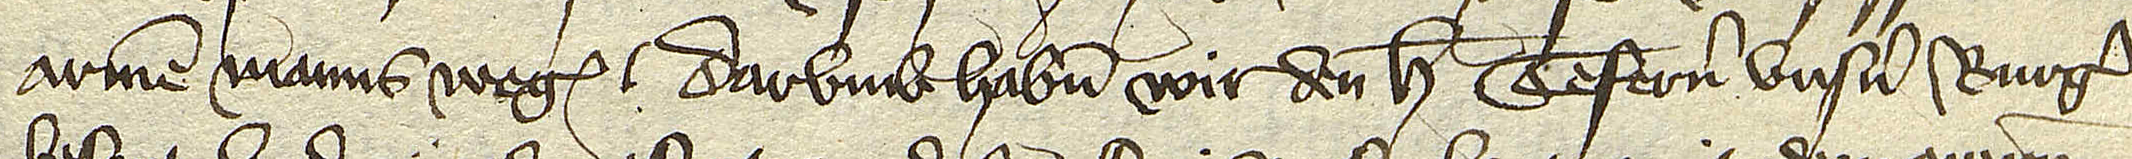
arme* manns weg* / Darvmb habn* wir den H* Tefern* vnſn* Burg*
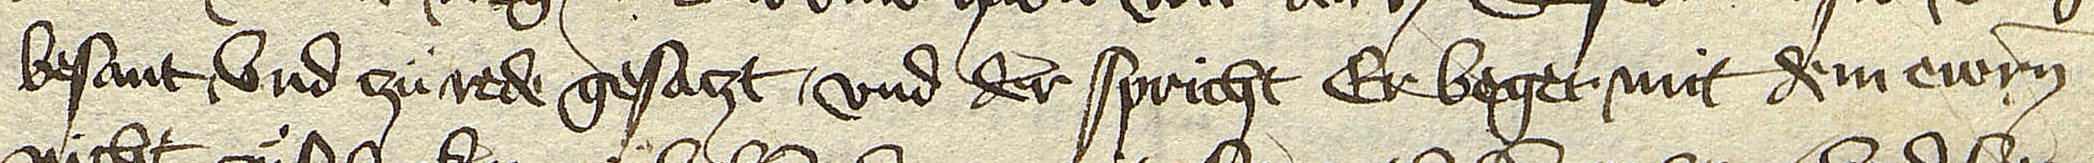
beſant / vnd cʒü rede geſacʒt / vnd der ſpricht Er beger mit dem ewrn*
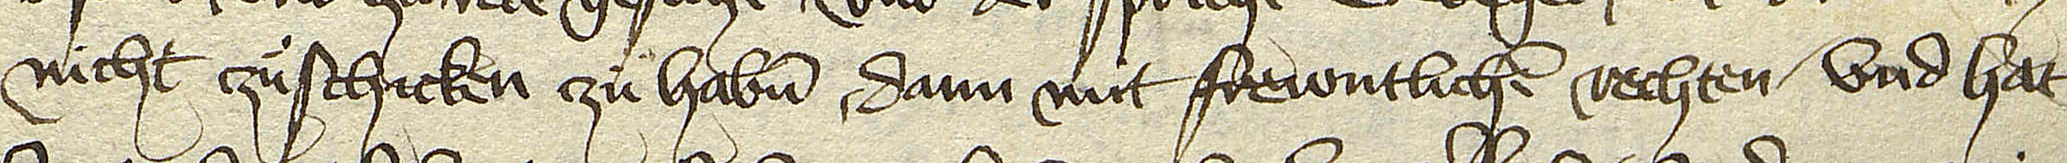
nicht cʒü ſchicken cʒü habn* / dann mit frewntliche* rechten / vnd hat
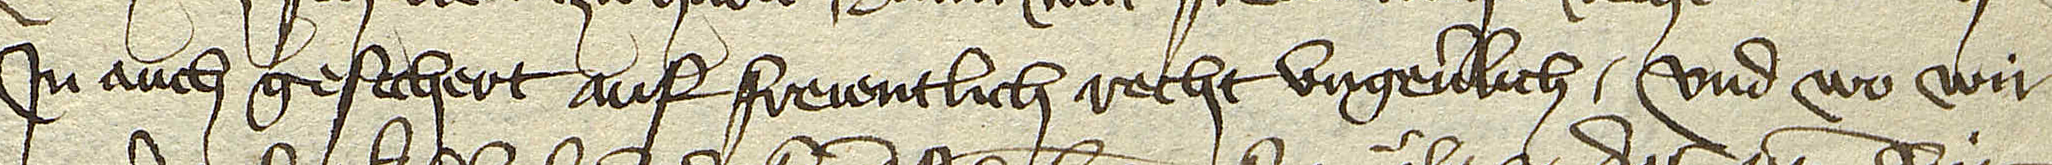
In auch geſichert auf frewntlich recht vngeu*lich / vnd wo wir
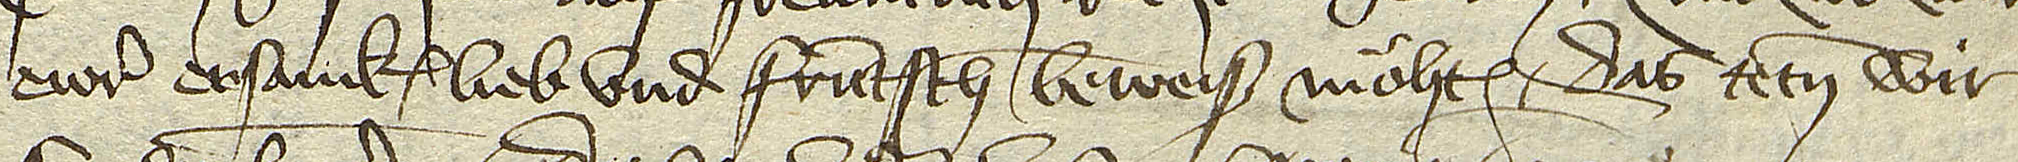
ewr* erſamk* lieb vnd fru*tſch* beweiſ* möht* / das tetn* wir
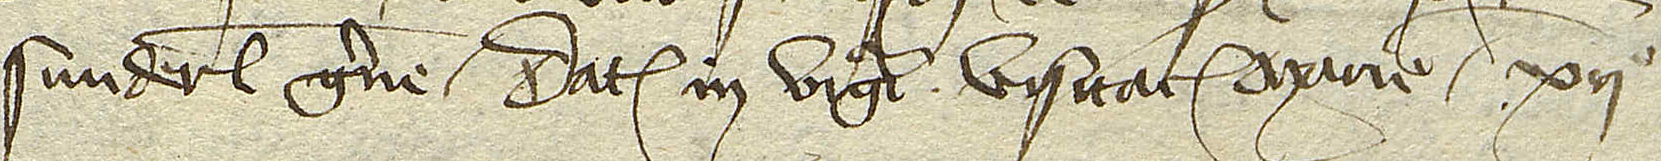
ſunderl* g*ne / Dat* in vigi viſitat Marie / xii*
